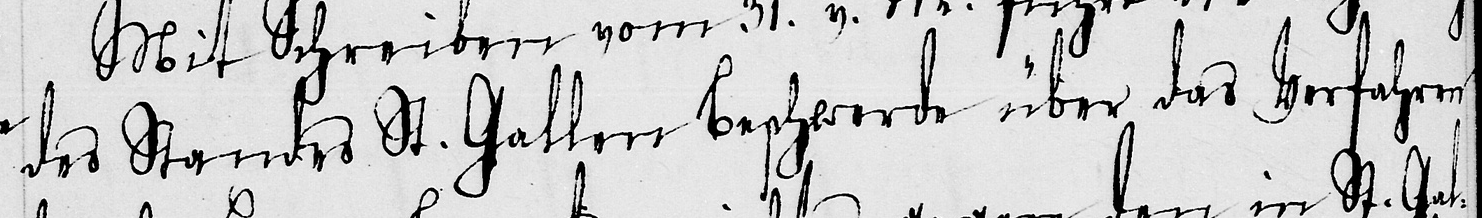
des Standes St. Gallen Beschwerde über das Verfahren
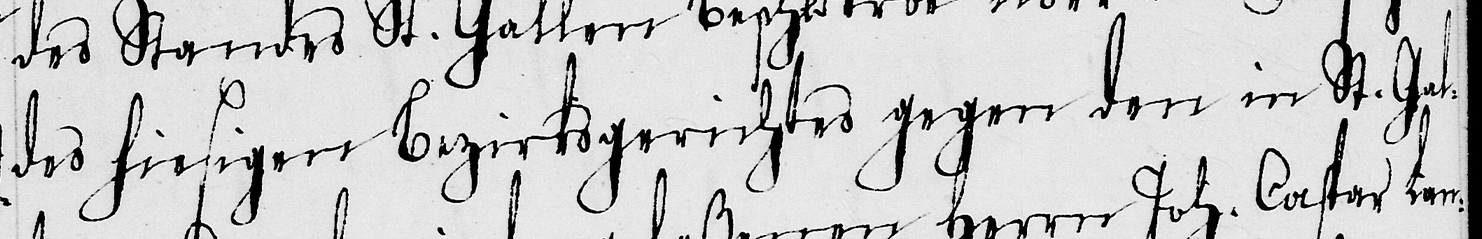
des hiesigen Bezirksgerichtes gegen den in St. Gal¬
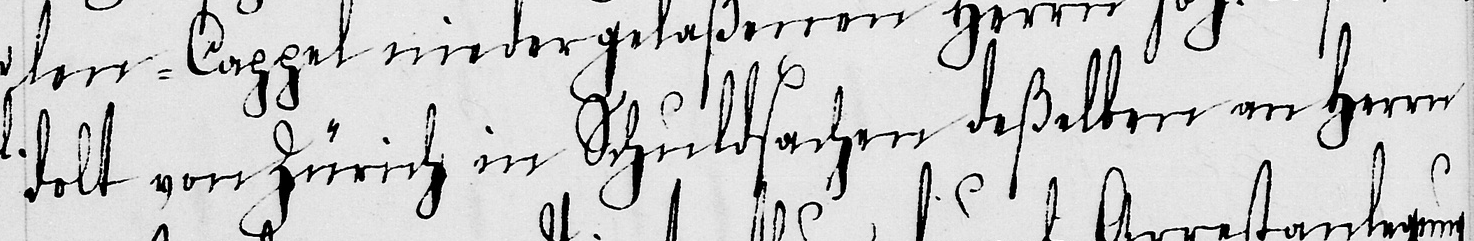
dolt von Zürich in Schuldsachen deßelben an Herrn
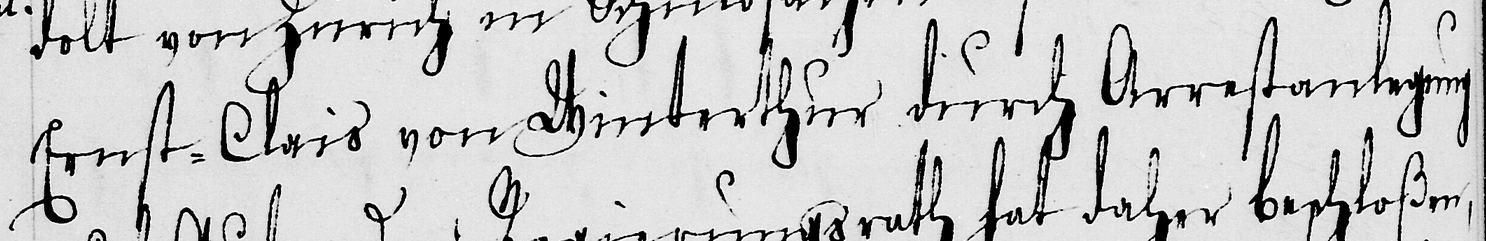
Ernst-Clais von Winterthur durch Arrestanlegung
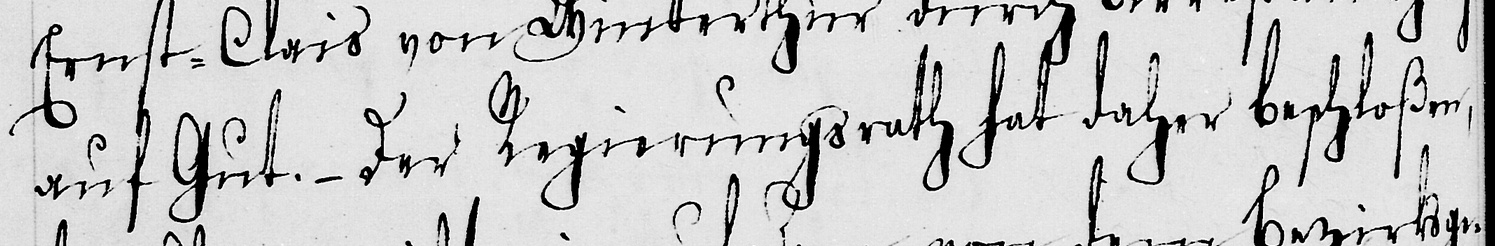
auf Gut. – Der Regierungsrath hat daher beschloßen,
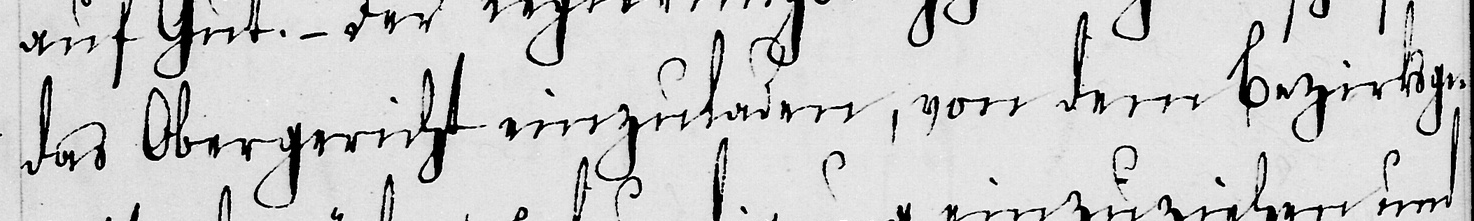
das Obergericht einzuladen, von dem Bezirksg¬
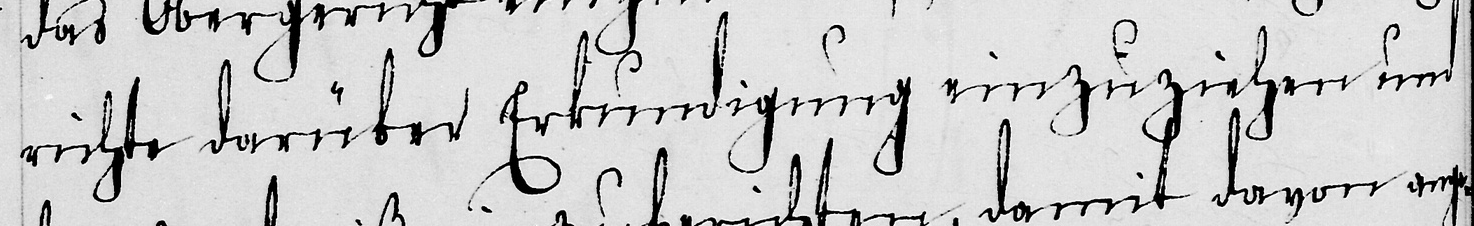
erichte darüber Erkundigung einzuziehen und
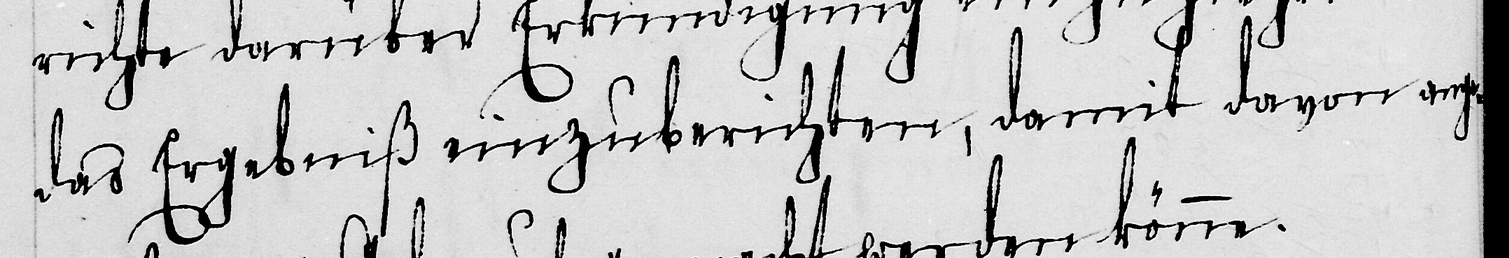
das Ergebniß einzuberichten, damit davon ange¬
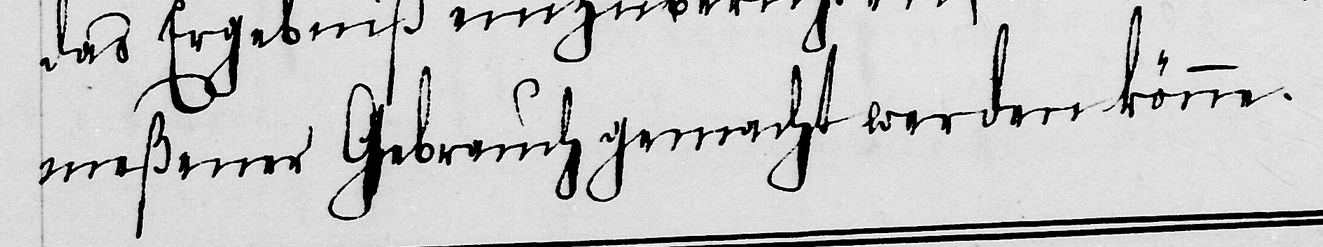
meßener Gebrauch gemacht werden könne.
